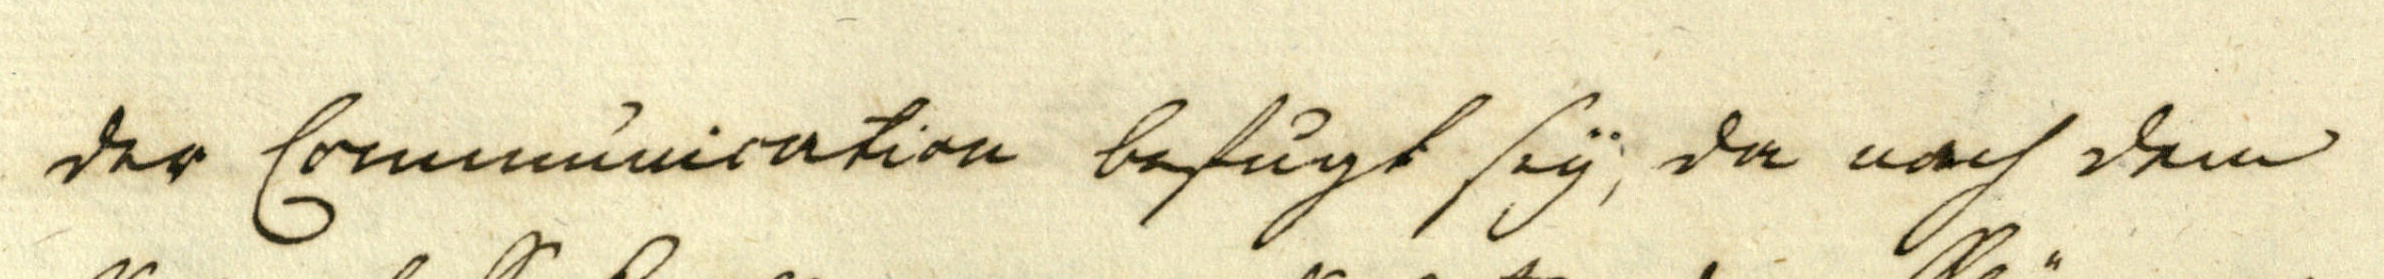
der Communication befugt seÿ, da nach dem
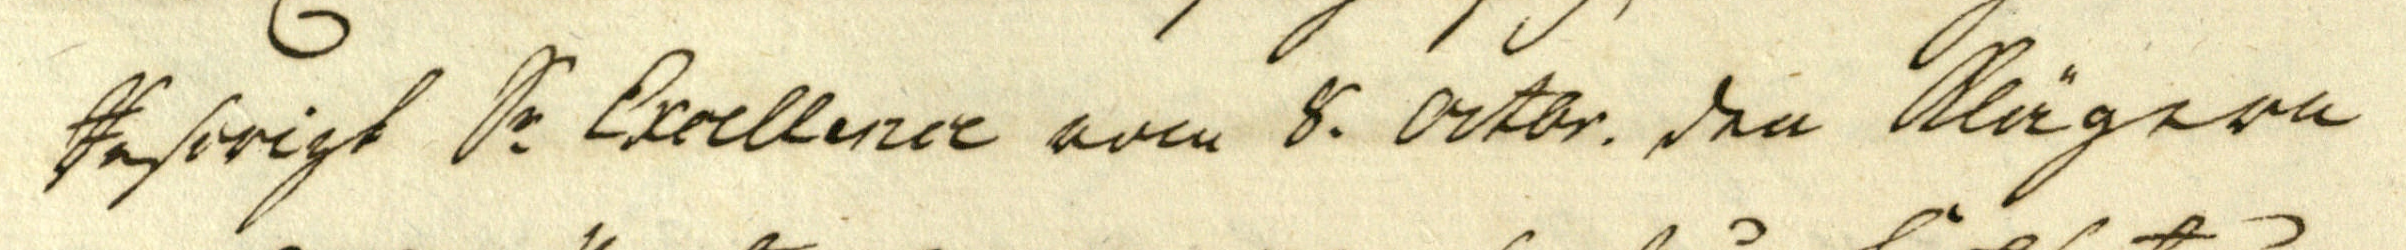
Rescript Sr Excellence vom 8. Octbr. den Klägern
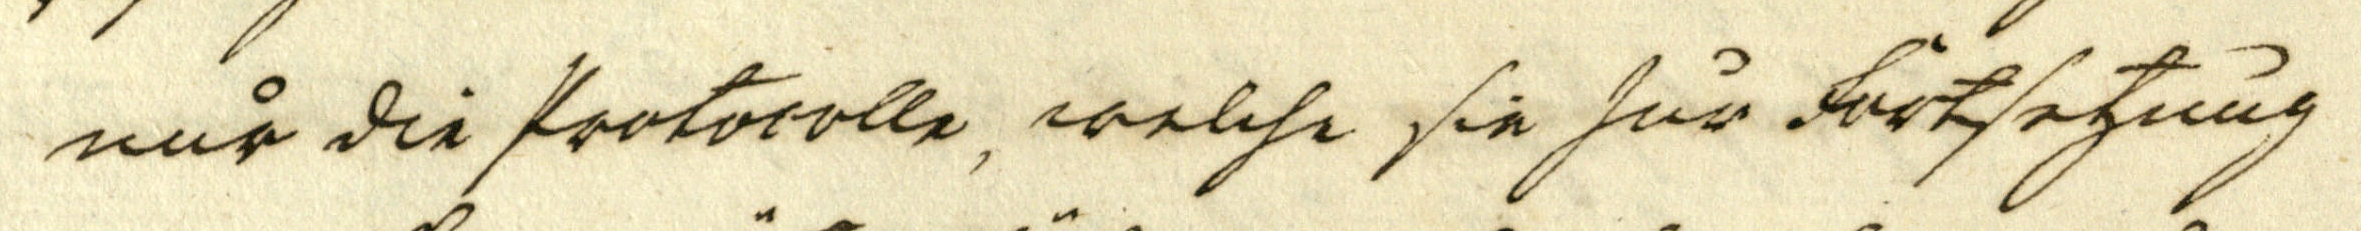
nur die Protocolle, welche sie zur Fortsetzung
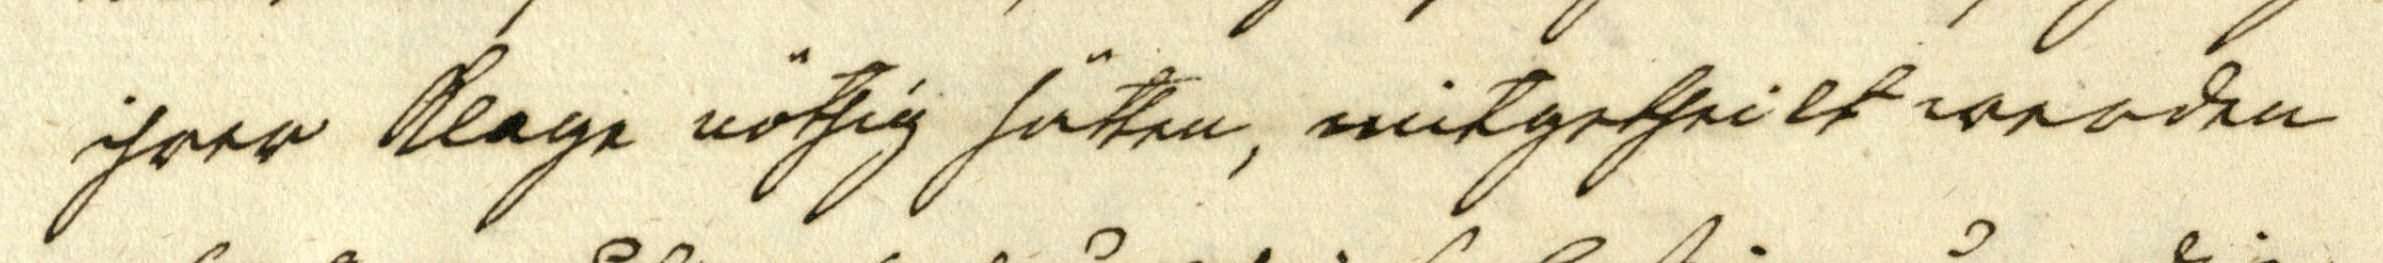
ihrer Klage nöthig hätten, mitgetheilt werden
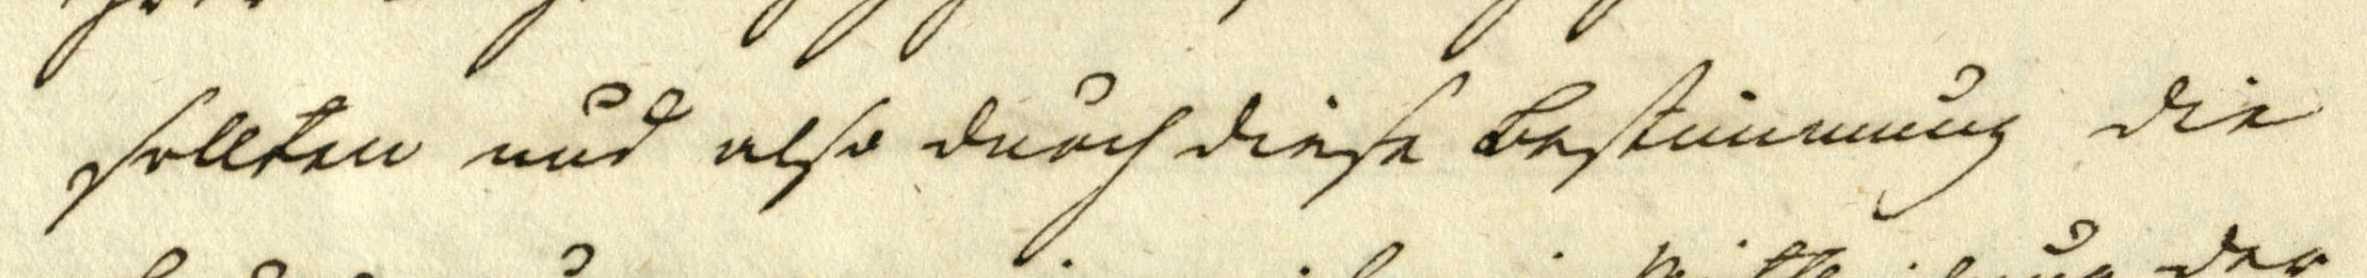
sollten und also durch diese Bestimmung die
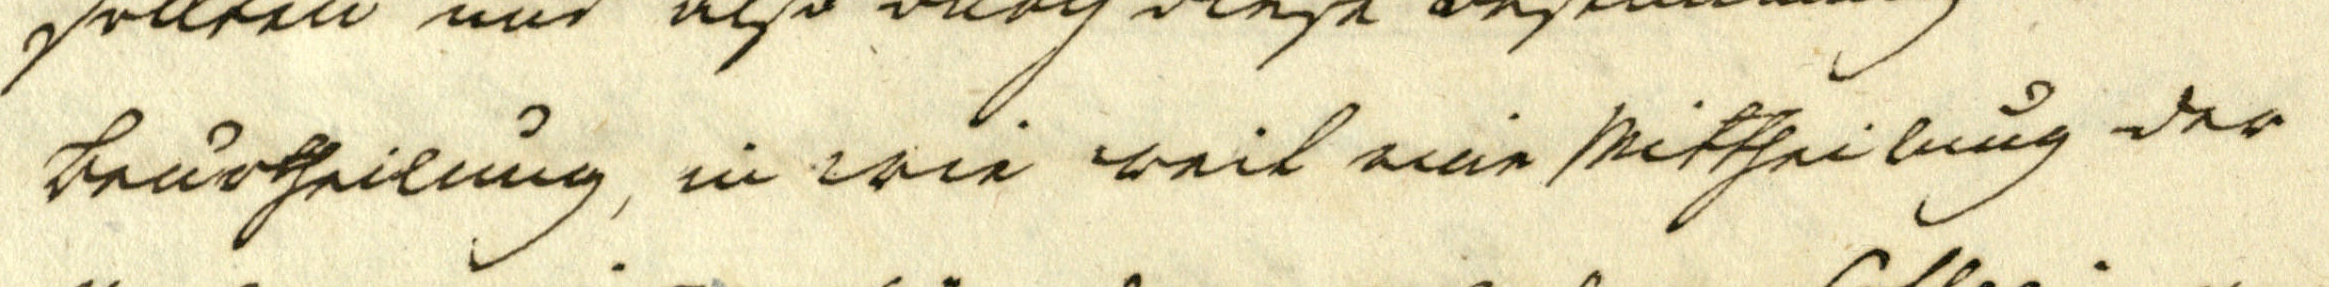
Beurtheilung, in wie weit eine Mittheilung der
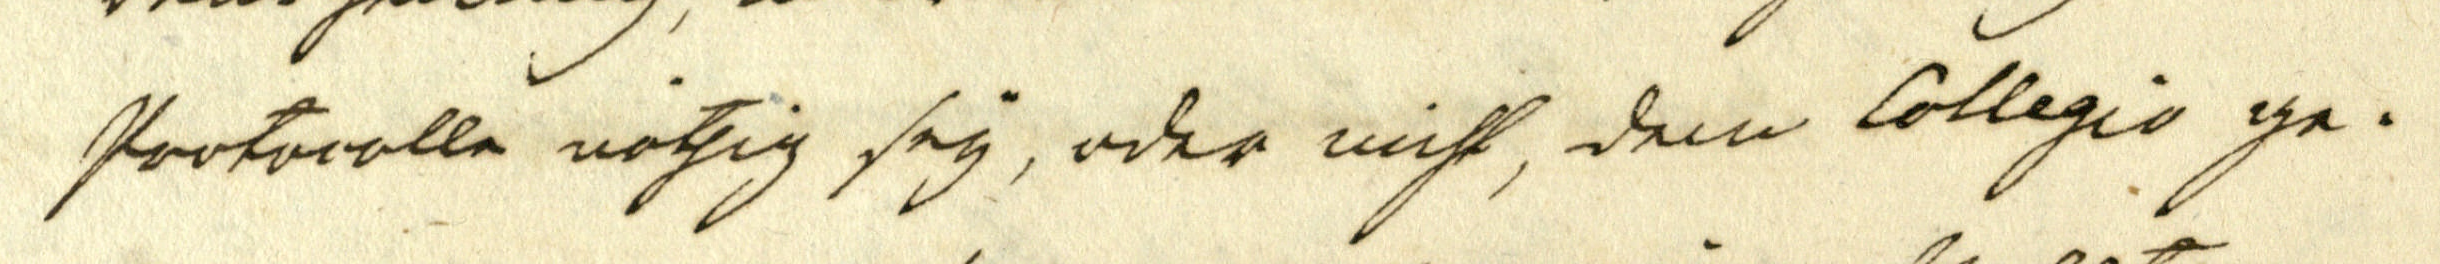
Protocolle nöthig seÿ, oder nicht, dem Collegio ge¬
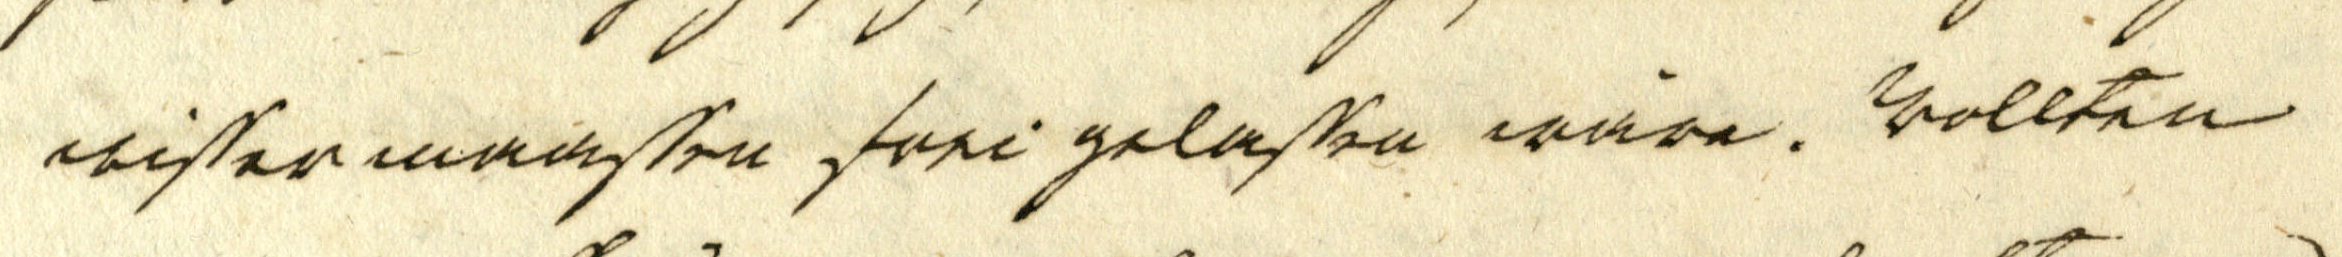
wisser maassen frei gelassen wäre. Wollten
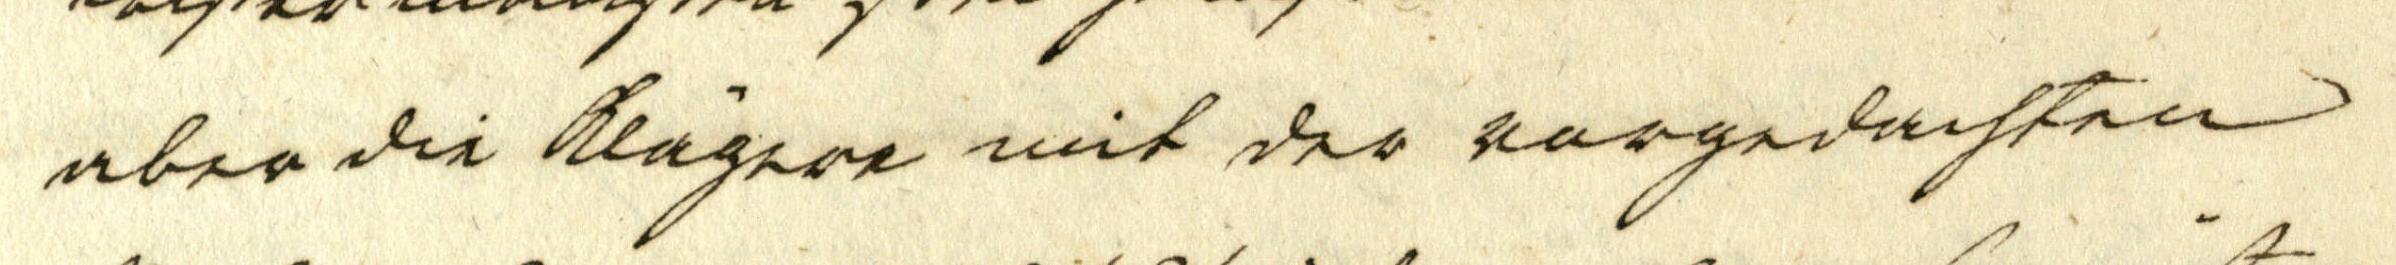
aber die Klägere mit der vorgedachten
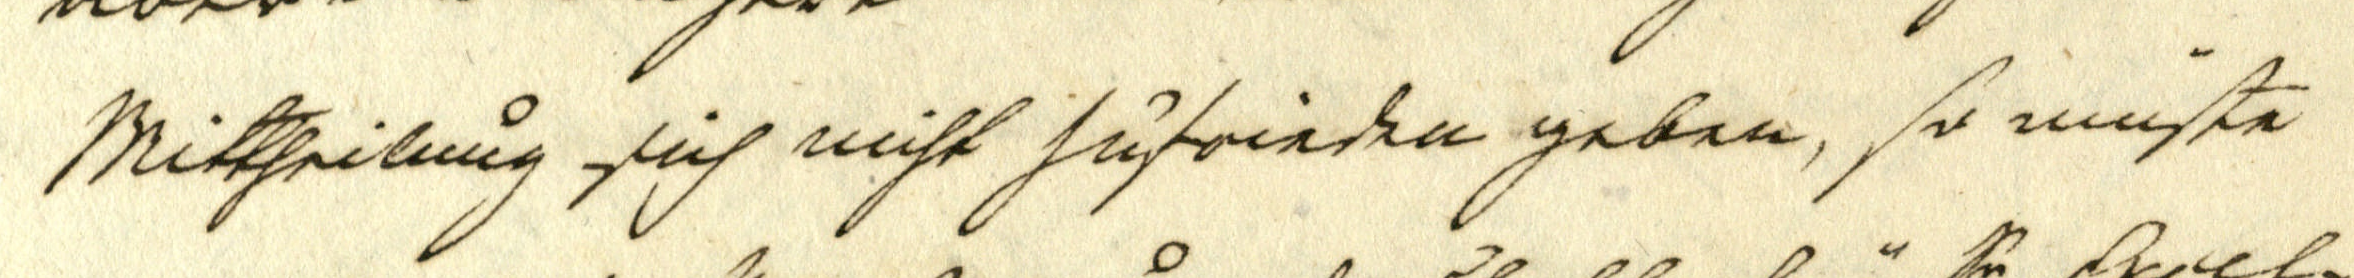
Mittheilung sich nicht zufrieden geben, so müßte
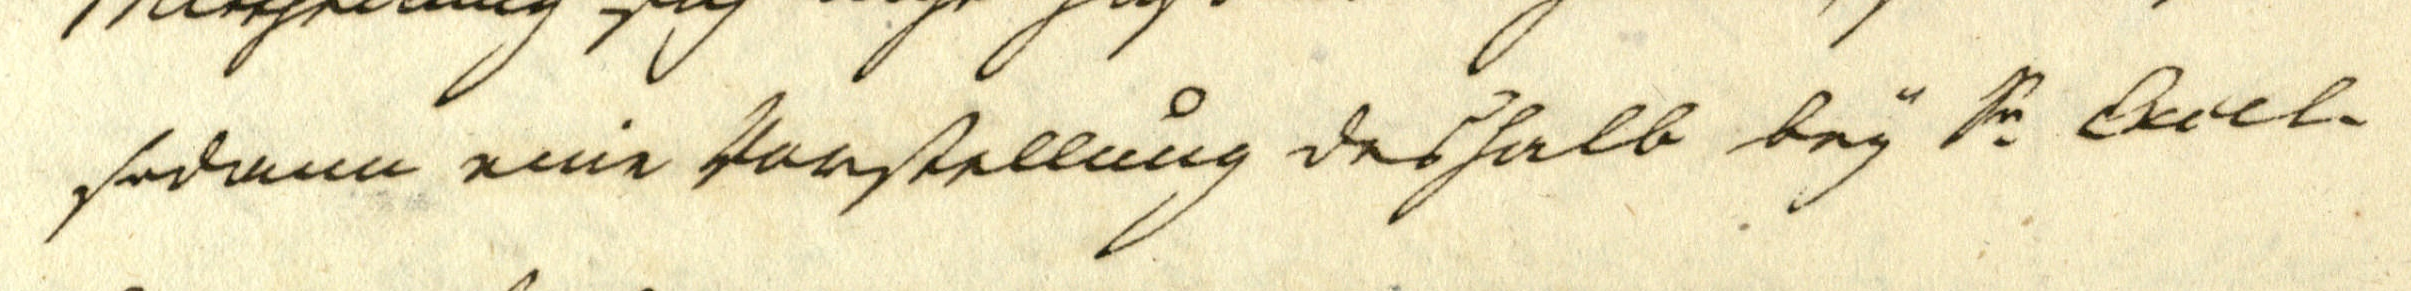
sodann eine Vorstellung deshalb beÿ Sr. Excel¬
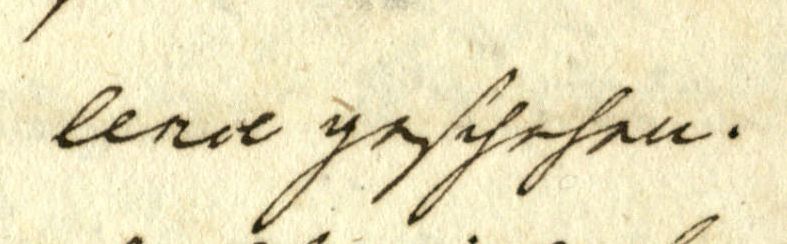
lence geschehen.
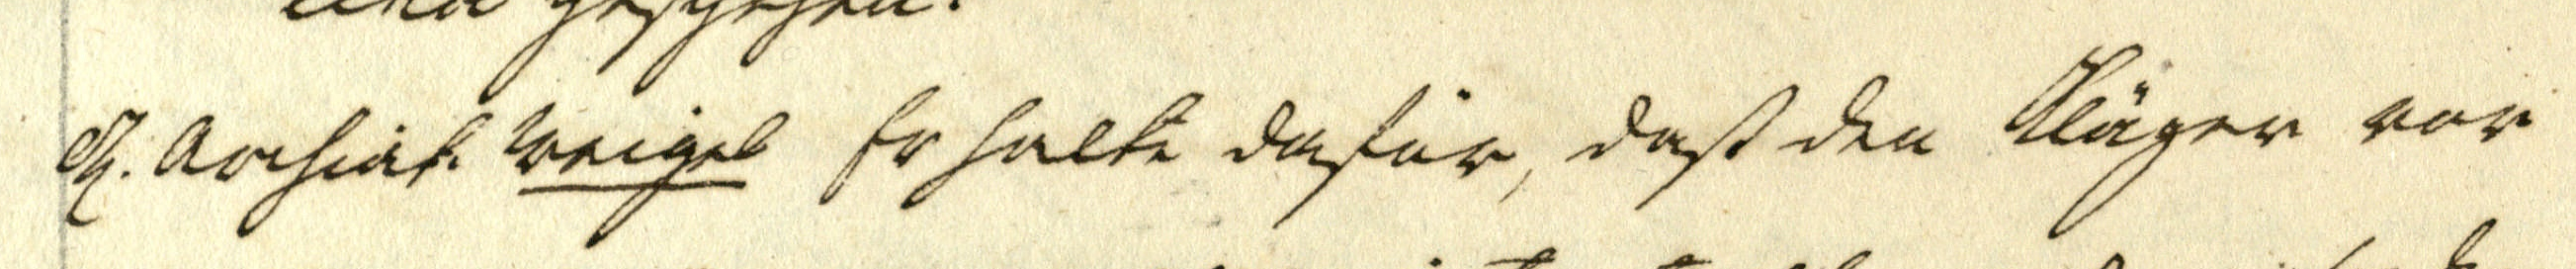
dh. Archiat. Weigel Er halte dafür, daß den Kläger vor
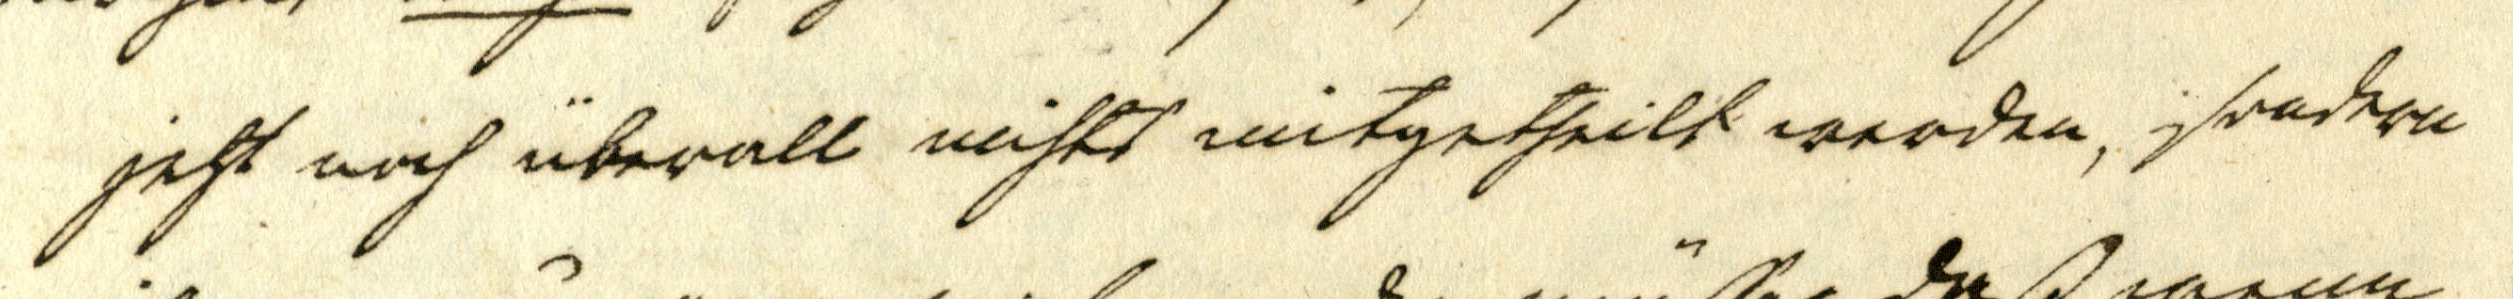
jetzt noch überall nicht mitgetheilt werden, sondern
